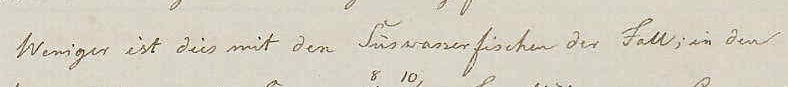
Weniger ist dies mit den Süswasserfischen der Fall; in den
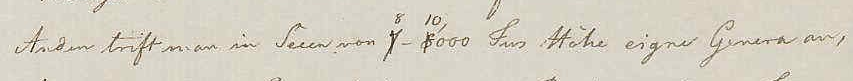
Anden trift man in Seeen von 78–810,000 Fus Höhe eigne Genera an,
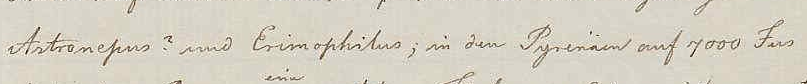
Astronepus ? und Erimophilus; in den Pyrenäen auf 7000 Fus
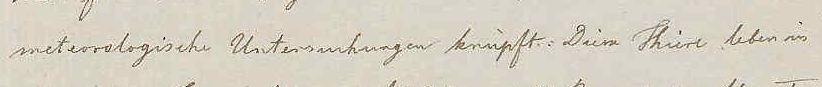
meteorologische Untersuchungen knüpft: Diese Thiere leben in
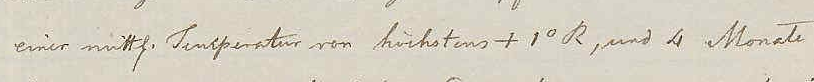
einer mittl. Temperatur von höchstens +1° R, und 4 Monate
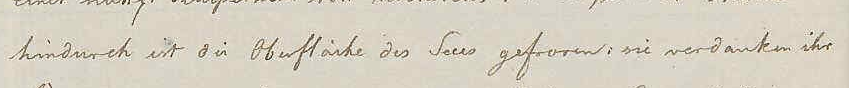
hindurch ist die Oberfläche des Seees gefroren: sie verdanken ihr
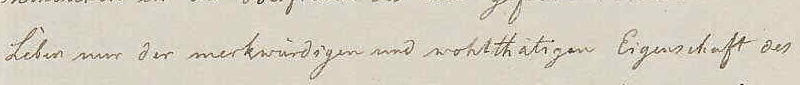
Leben nur der merkwürdigen und wohlthätigen Eigenschaft des
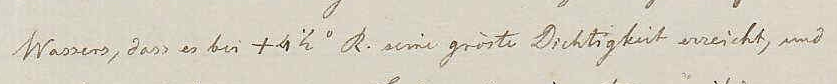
Wassers, dass es bei +4½° R. seine gröste Dichtigkeit erreicht, und
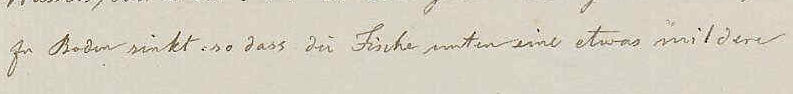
zu Boden sinkt: so dass die Fische unten eine etwas mildere
